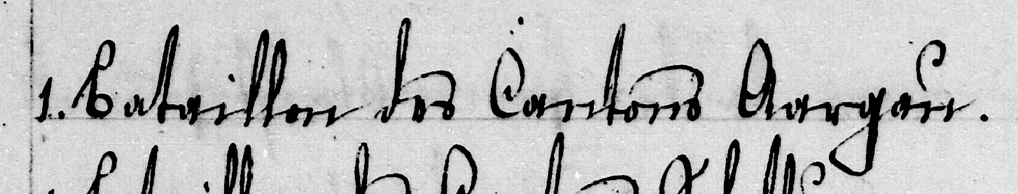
1. Bataillon des Cantons Aargau.
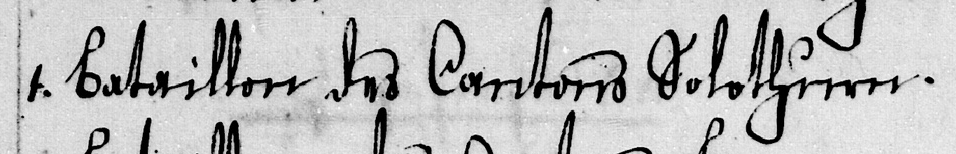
1. Bataillon des Cantons Solothurn.
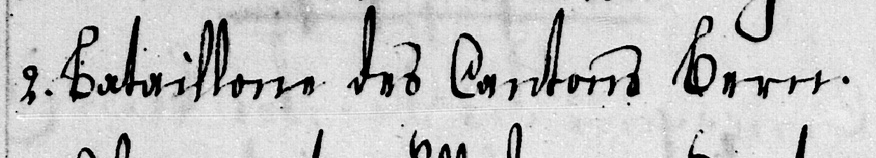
2. Bataillone des Cantons Bern.
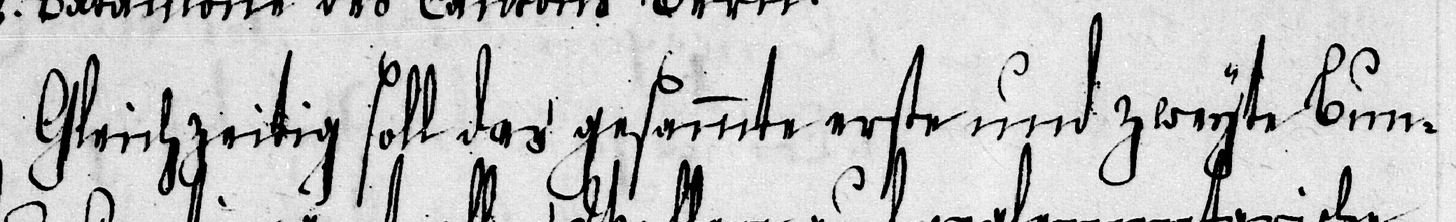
Gleichzeitig soll das gesammte erste und zweyte Bun¬
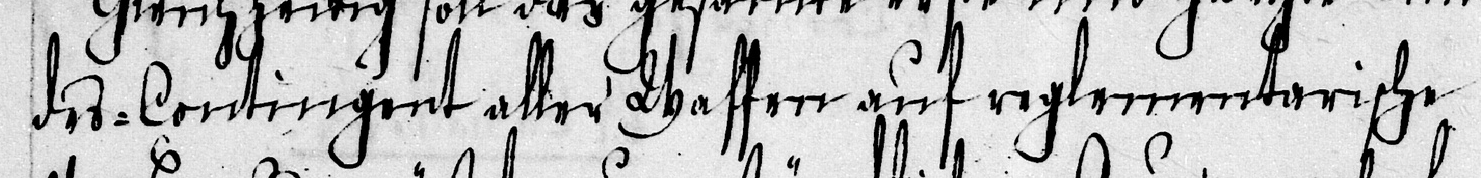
des-Contingent aller Waffen auf reglementarische
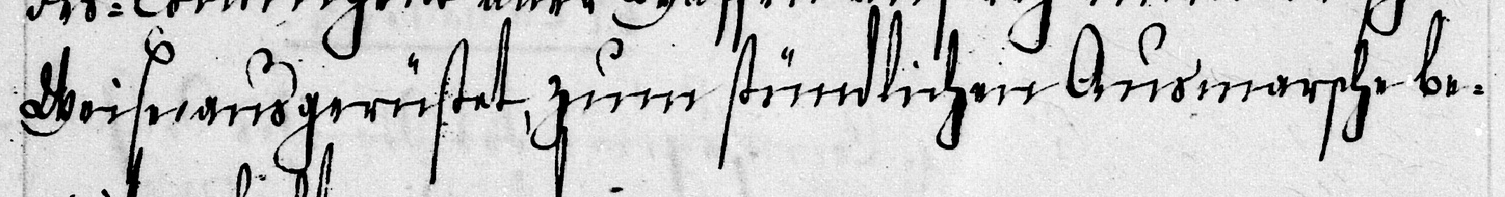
Weise ausgerüstet, zum stündlichen Ausmarsche be¬
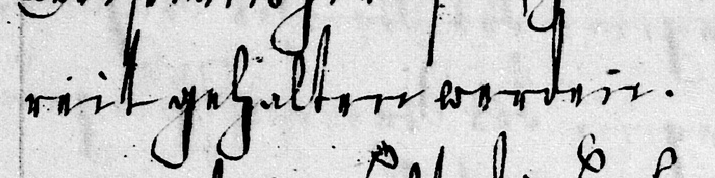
reit gehalten werden.
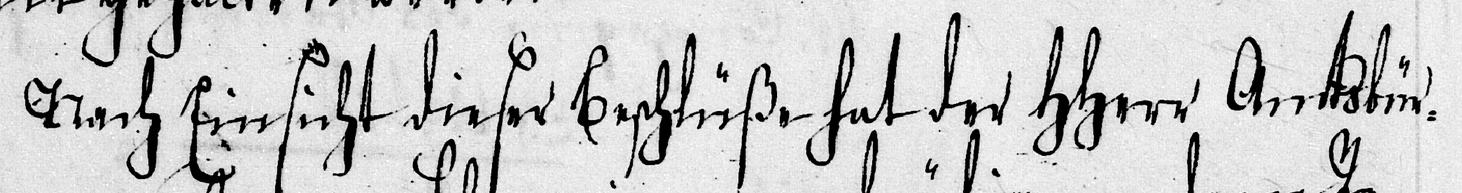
Nach Einsicht dieser Beschlüße hat der HHerr Amtsbür¬
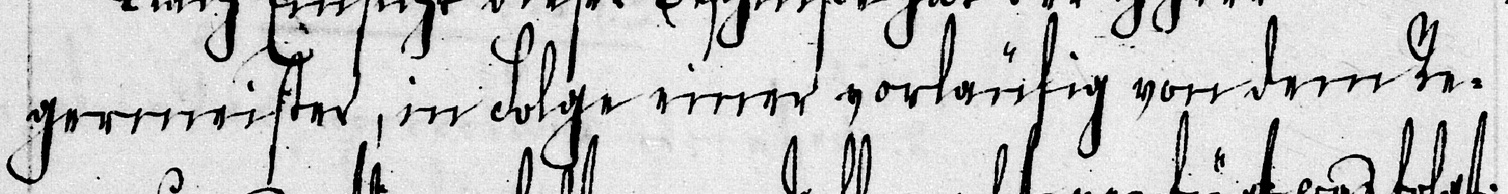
germeister, in Folge einer vorläufig von dem Re¬
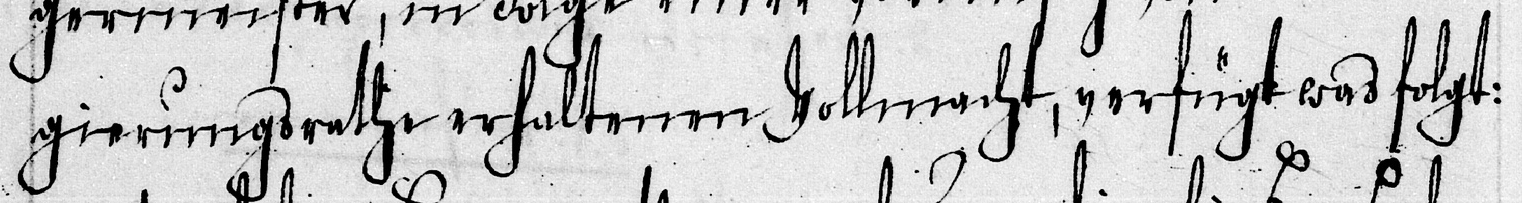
gierungsrathe erhaltenen Vollmacht, verfügt was folgt:
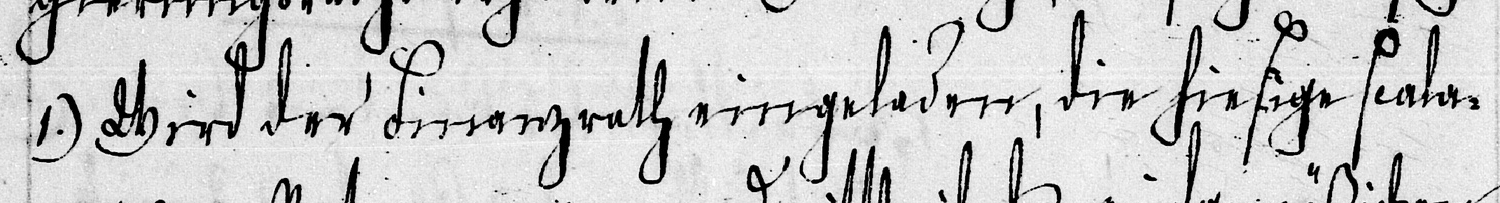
1.) Wird der Finanzrath eingeladen, die hiesige scala¬
